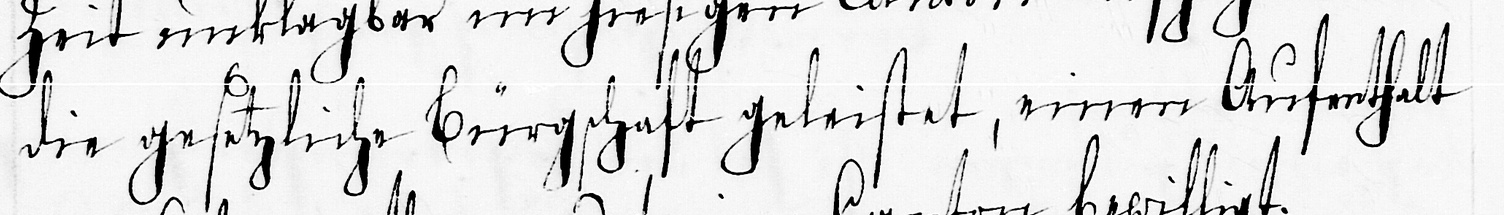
die gesetzliche Bürgschaft geleistet, einen Aufenthalt
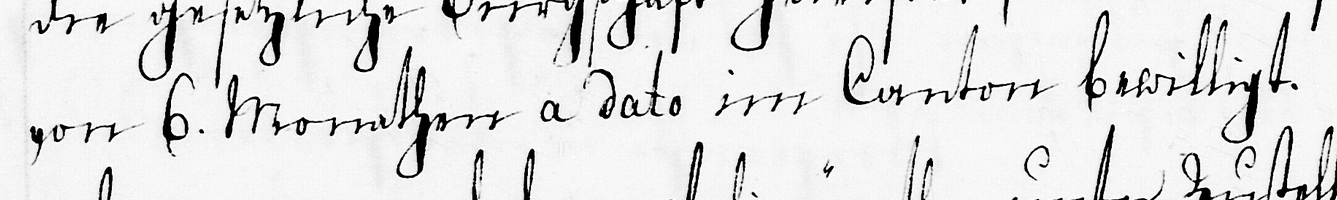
von 6. Monathen a dato im Canton bewilligt.
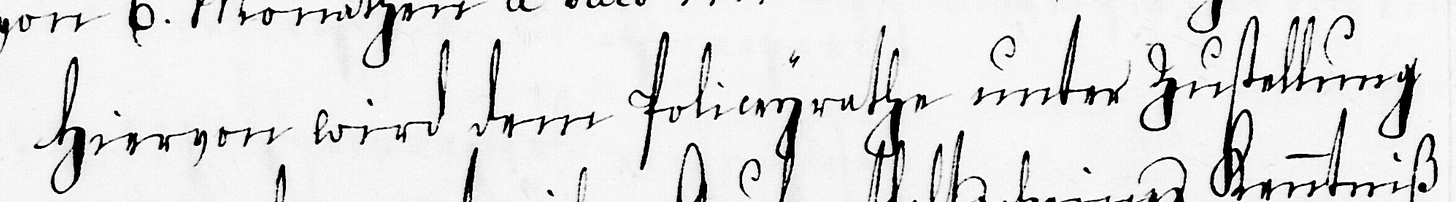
Hiervon wird dem Policeyrathe unter Zustellung
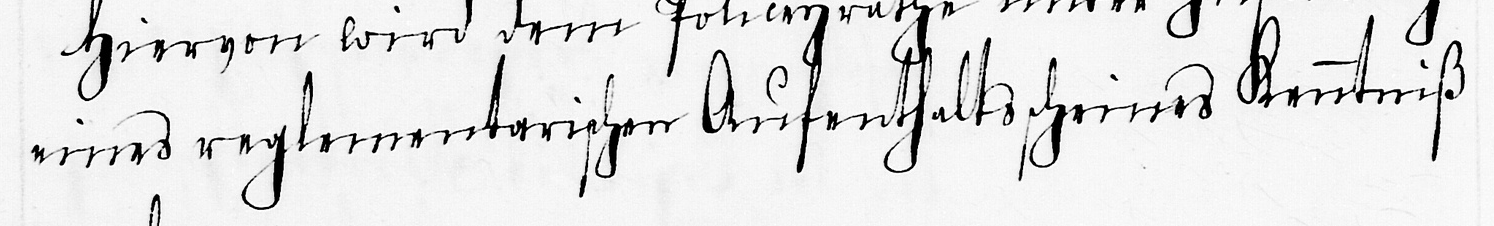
eines reglementarischen Aufenthaltsscheines Kenntniß
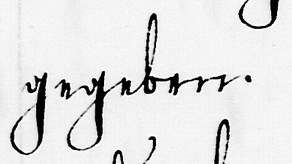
gegeben.
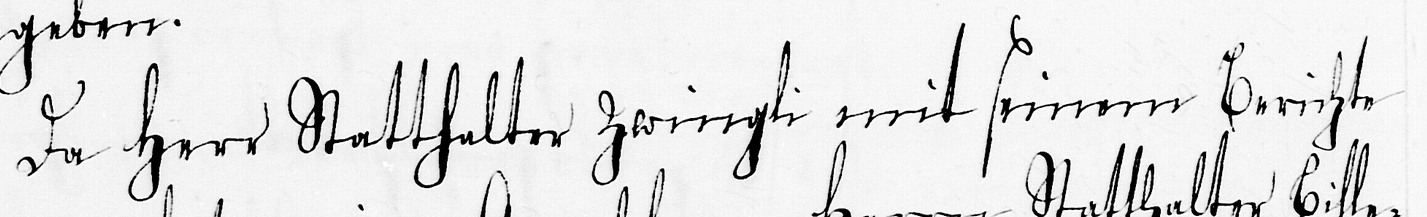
Da Herr Statthalter Zwingli mit seinem Berichte
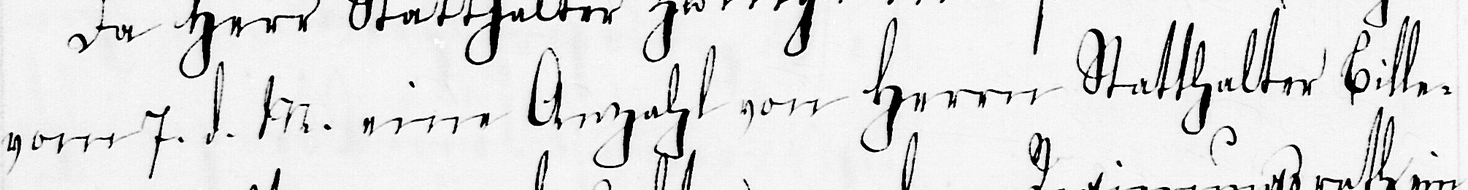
vom 7. d. M. eine Anzahl von Herrn Statthalter Bille¬
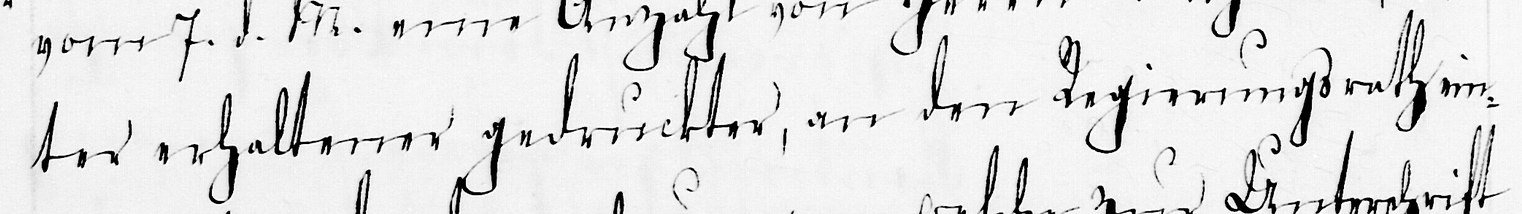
ter erhaltener gedruckter, an den Regierungsrath ein¬
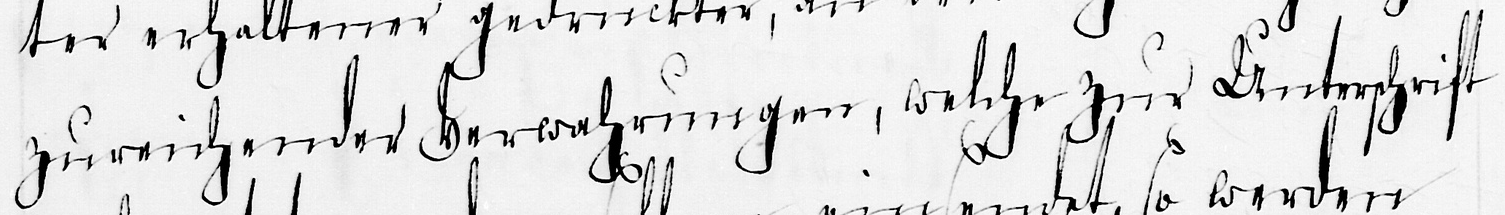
zureichender Verwahrungen, welche zur Unterschrift
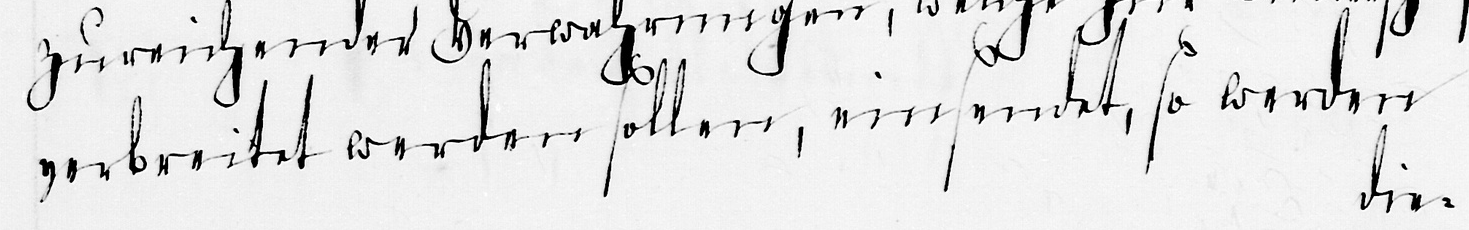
verbreitet werden sollen, einsendet, so werden
